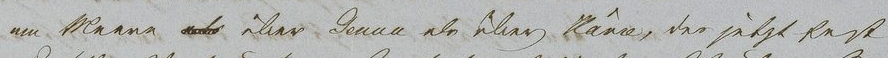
am Meere über Genua als über Hâvre, das jetzt fast
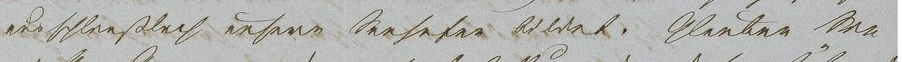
ausschliesslich unsern Seehafen bildet. Glauben Sie
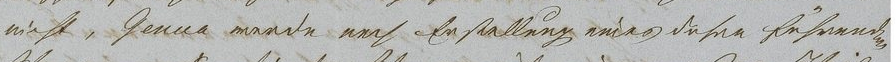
nicht, Genua werde nach Erstellung eines dahin führenden
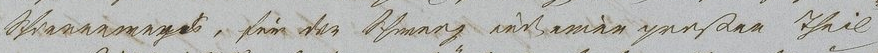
Schienenweges, für die Schweiz und einen großen Theil
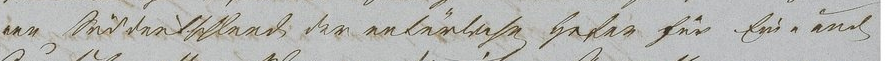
von Süddeutschland der natürliche Hafen für Ein- und
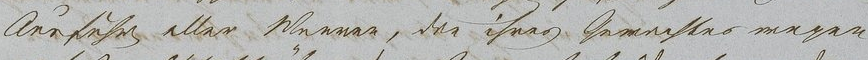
Ausfuhr aller Waaren, die ihres Gewichtes wegen
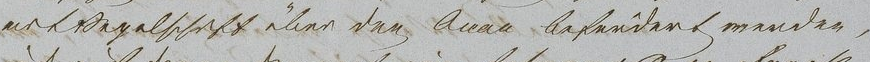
mit Segelschiff über den Ocean befördert werden,
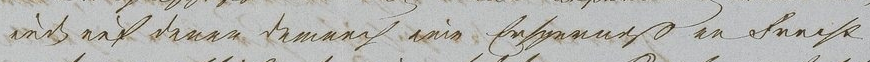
und auf denen demnach eine Ersparniß an Fracht
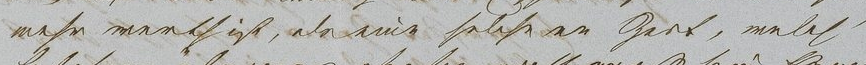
mehr werth ist, als eine solche an Zeit, welch'
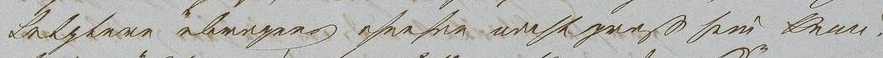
Letztere übrigens ohnehin nicht groß sein kann?
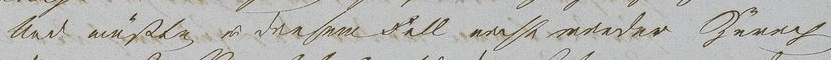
Und müßte in diesem Fall nicht wieder Zürich
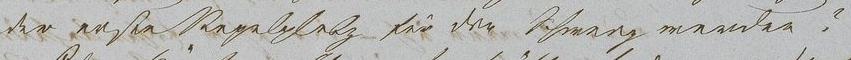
der erste Stapelplatz für die Schweiz werden?
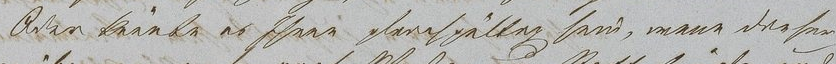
Oder könnte es Ihnen gleichgültig sein, wenn dieser
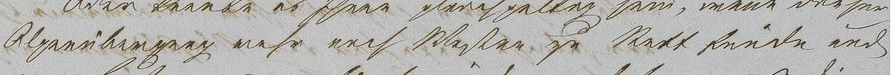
Alpenübergang mehr nach Westen zu Statt fände und
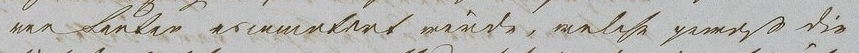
von Leuten escamotirt würde, welche gewiß die
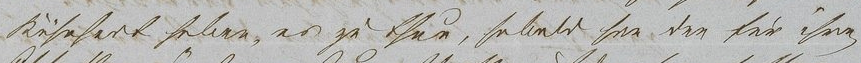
Kühnheit haben, es zu thun, sobald sie den für ihre
